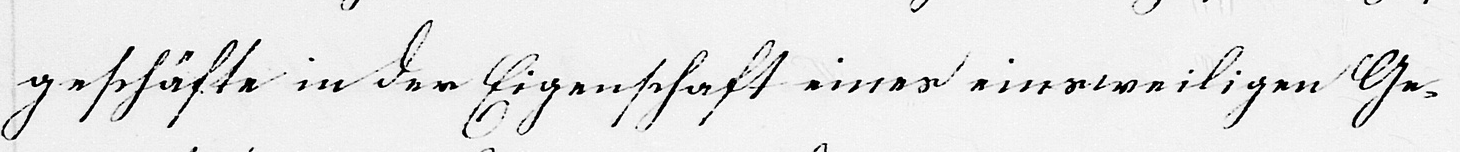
geschäfte in der Eigenschaft eines eins[t]weiligen Ge¬
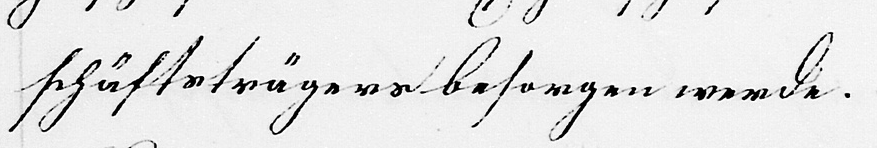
schäftsträgers besorgen werde.
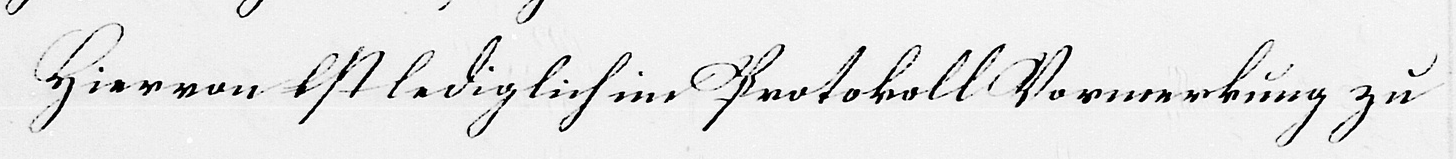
Hiervon ist lediglich im Protokoll Vormerkung zu
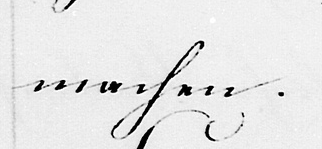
machen.
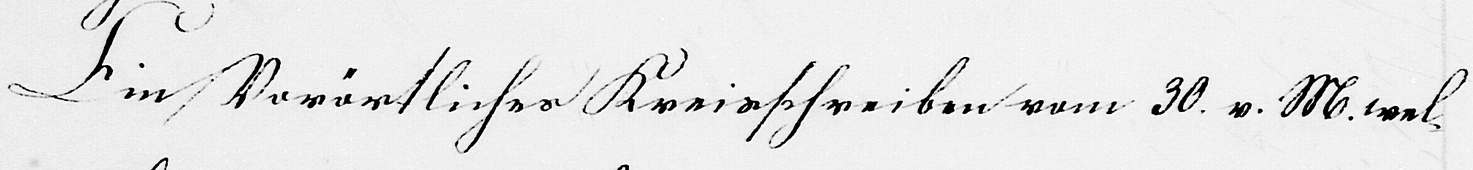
Ein Vorörtliches Kreisschreiben vom 30. v. M. wel¬
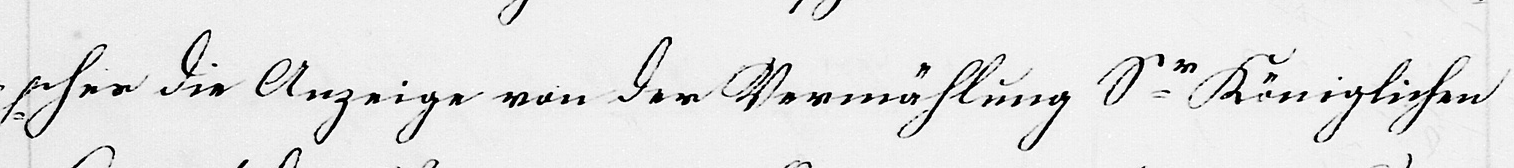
ches die Anzeige von der Vermählung Sr Königlichen
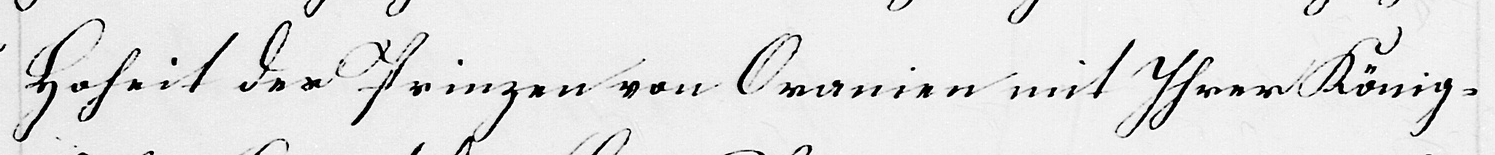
Hoheit des Prinzen von Oranien mit Ihrer König¬
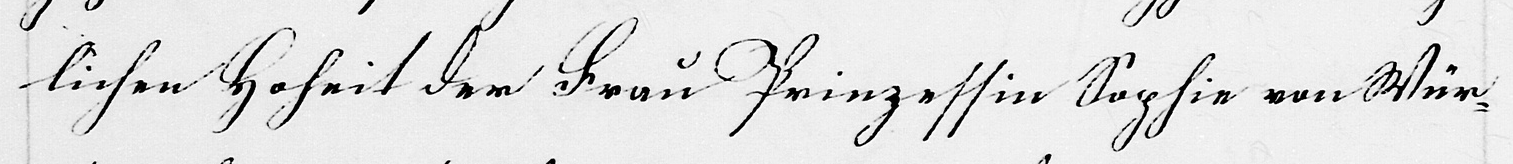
lichen Hoheit der Frau Prinzessin Sophie von Wür¬
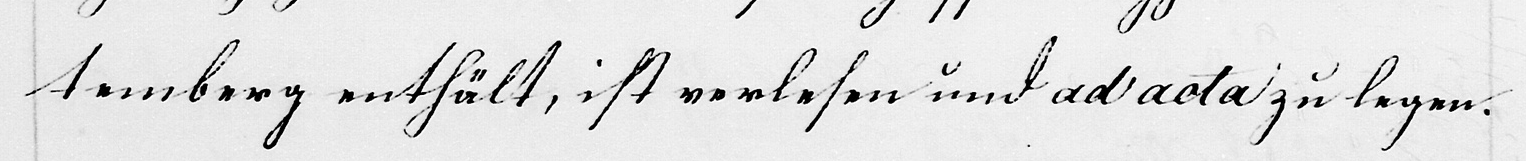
temberg enthält, ist verlesen und ad acta zu legen.
